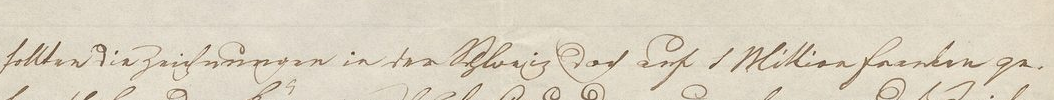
sollten die Zeichnungen in der Schweiz doch auf 1 Million Franken ge-
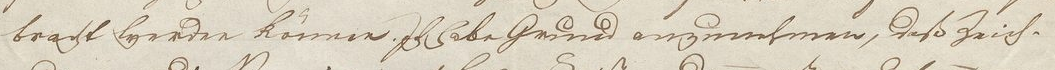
bracht werden können. Ich habe Grund anzunehmen, daß Zeich-
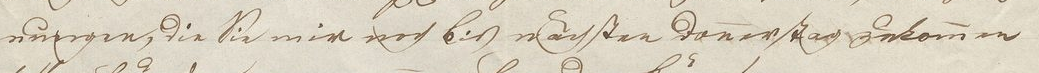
nungen, die Sie mir noch bis nächsten Donnerstag zukommen
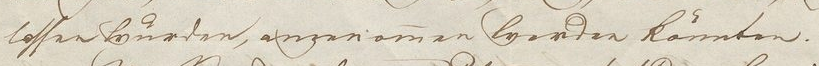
lassen würden, angenommen werden könnten.
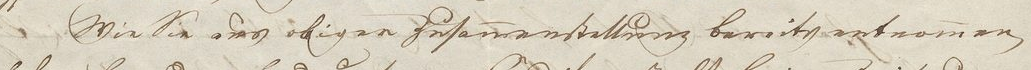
Wie Sie aus obiger Zusammenstellung bereits entnommen
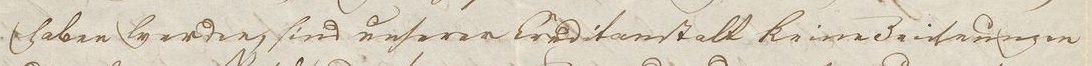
haben werden, sind unserer Creditanstalt keine Zeichnungen
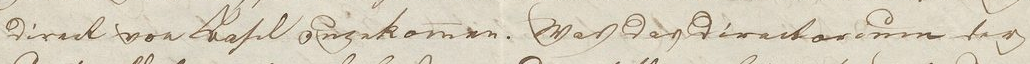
direct von Basel zugekommen. Was das Directorium der
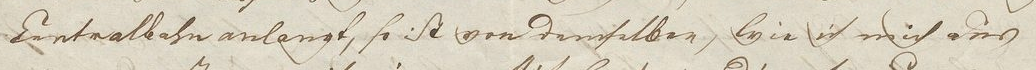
Centralbahn anlangt, so ist von demselben, wie ich mich aus
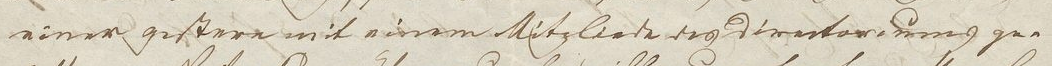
einer gestern mit einem Mitgliede des Direktoriums ge-
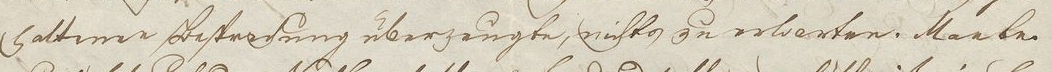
haltenen Besprechung überzeugte, nichts zu erwarten. Man be-
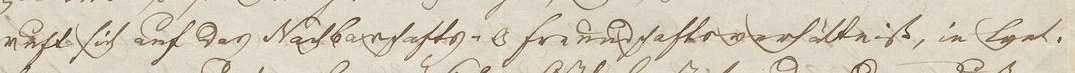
ruft sich auf das Nachbarschafts- & Freundschaftsverhältniß, in wel-
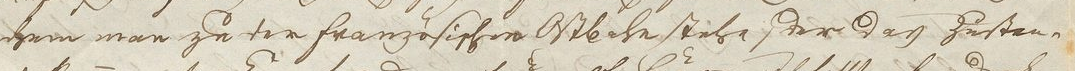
chem man zu der französischen Ostbahn stehe, der das Zustan-
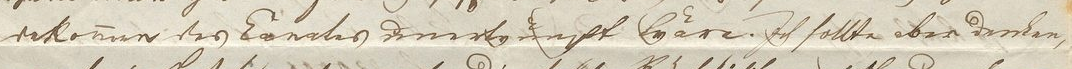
dekommen des Canales unerwünscht wäre. Ich sollte aber denken,
